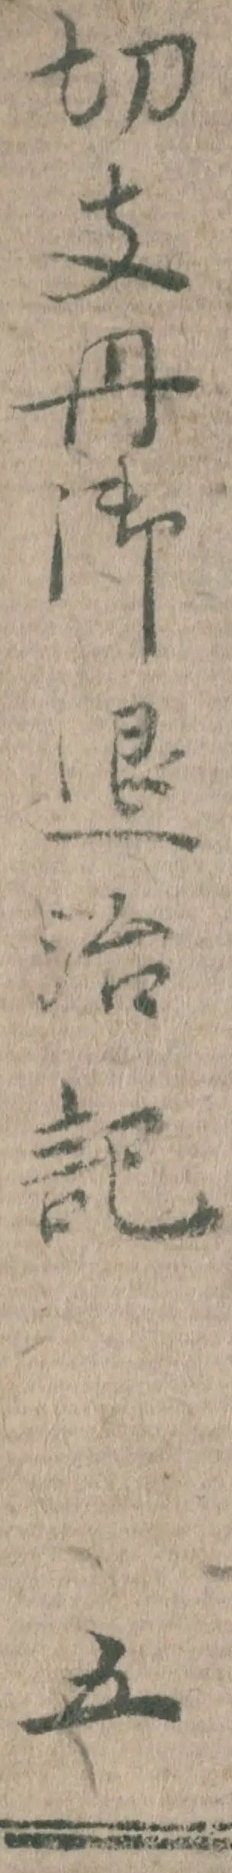切支丹御退治記五

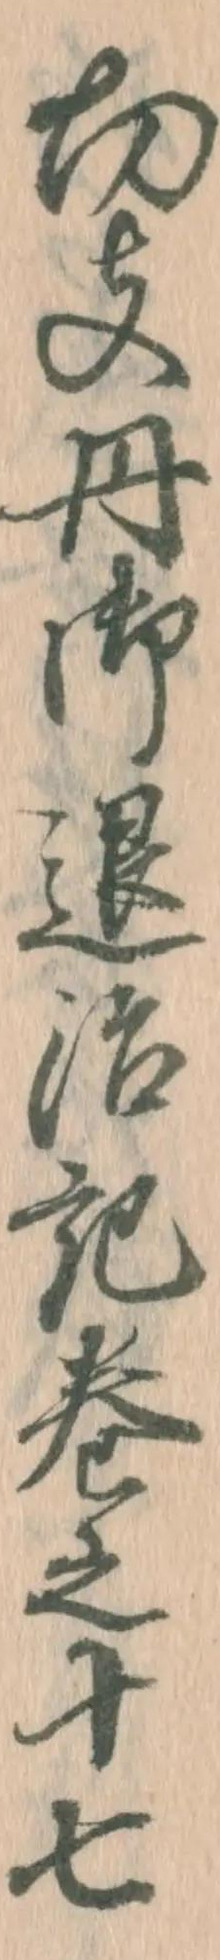切支丹御退治記巻之十七
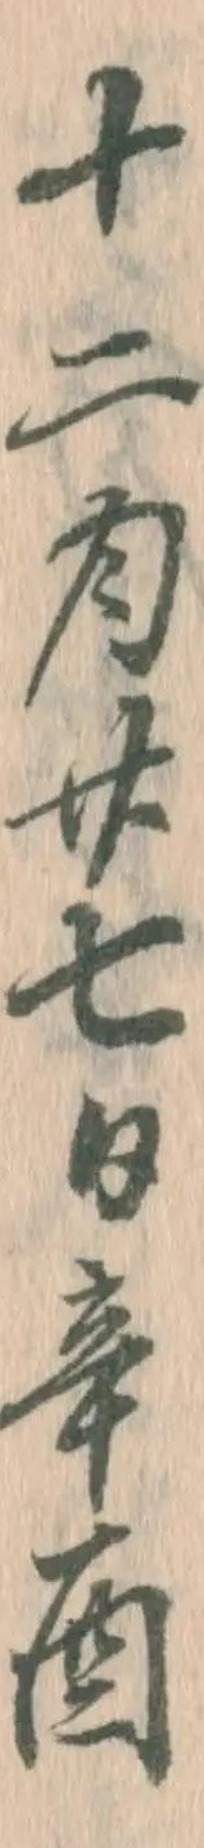十二月廿七日辛酉
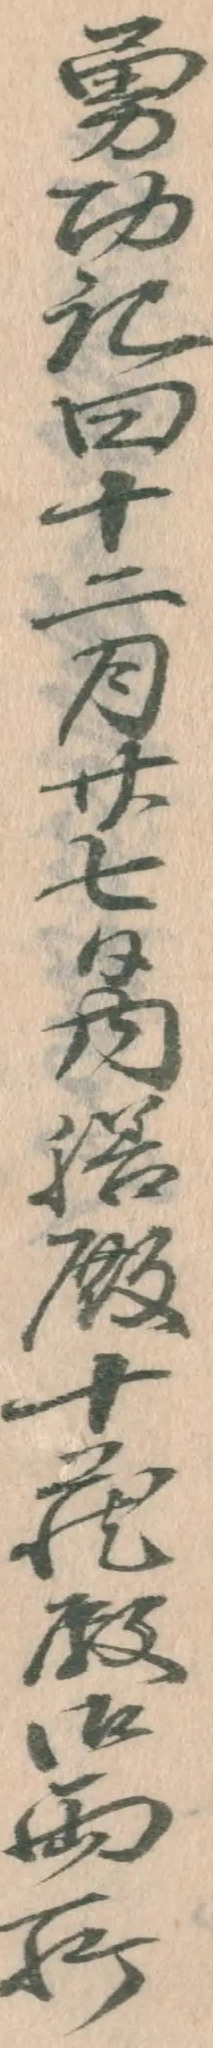勇功記曰十二月廿七日内膳殿十蔵殿御両所
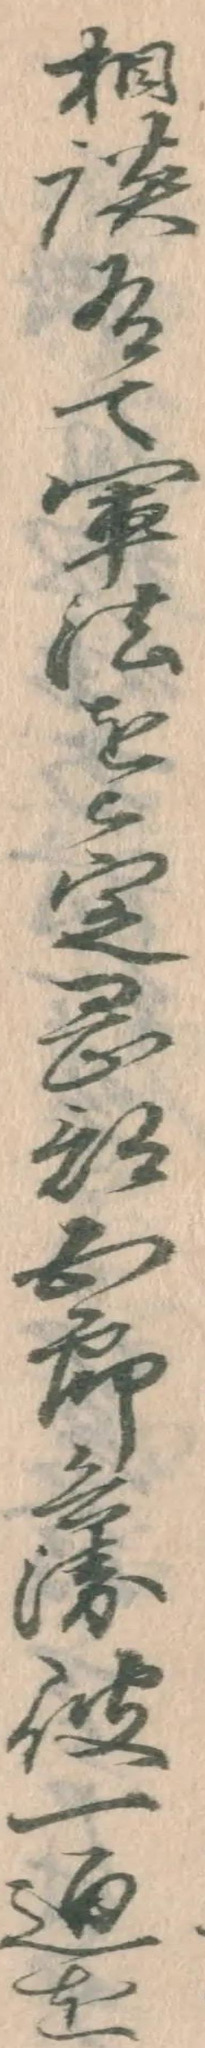相談有て軍法を被定岡部五郎兵衛彼一通を
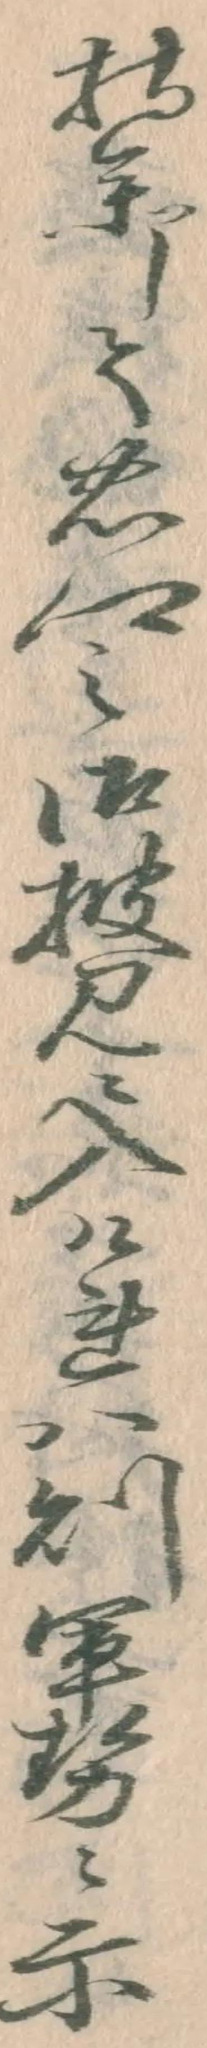持参して忠郷之御披見に入け連は則軍勢に示
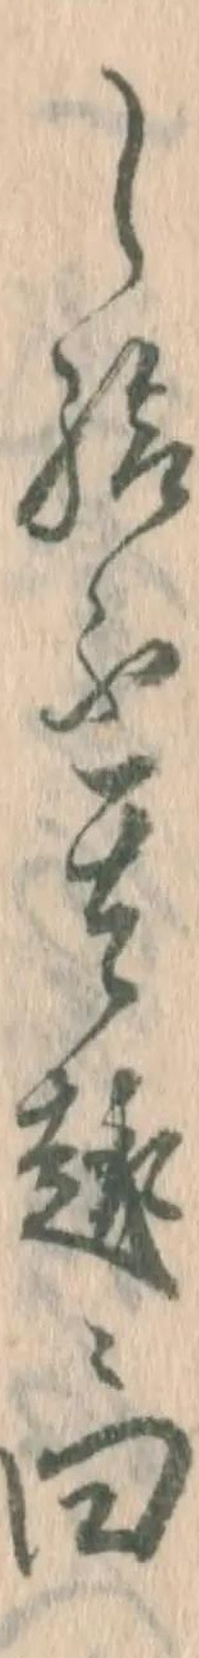し給ふ其趣に曰
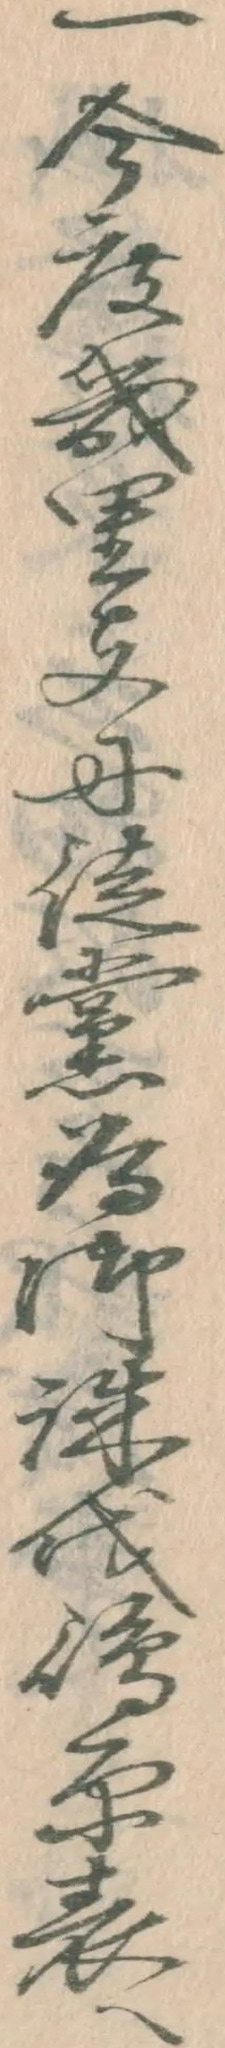一今度幾里支丹徒党為御誅伐島原表へ
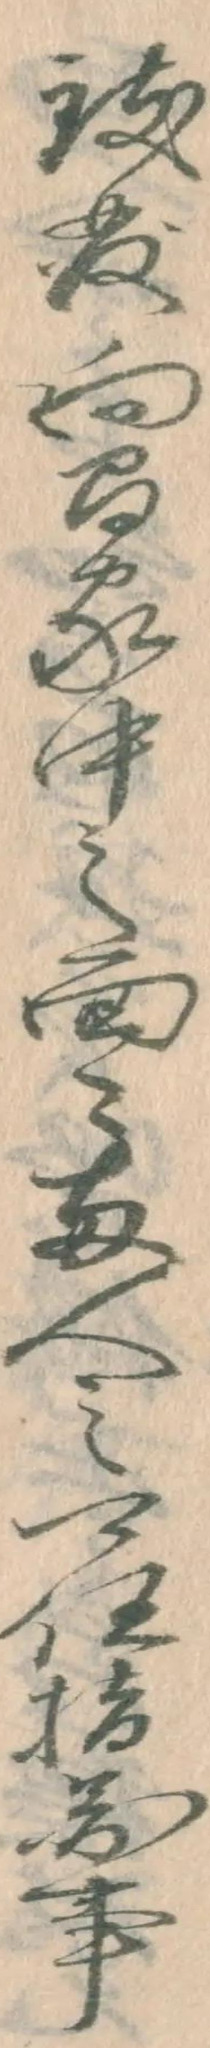致度向間家中之面々両人之可任指図事

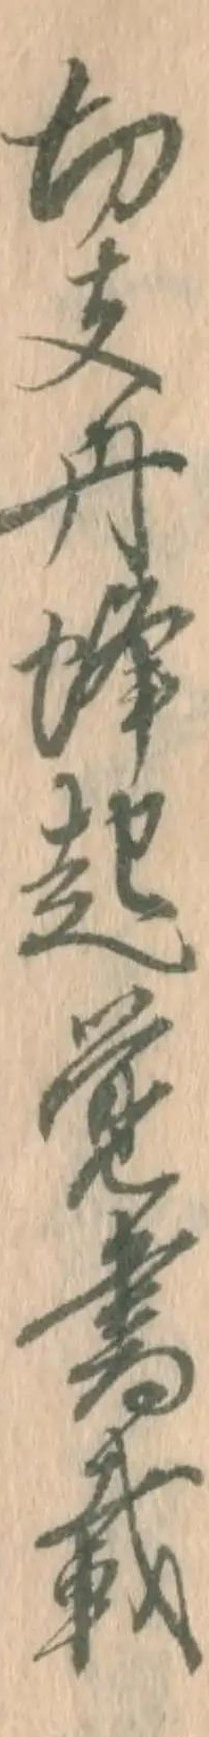切支丹蜂起覚書載
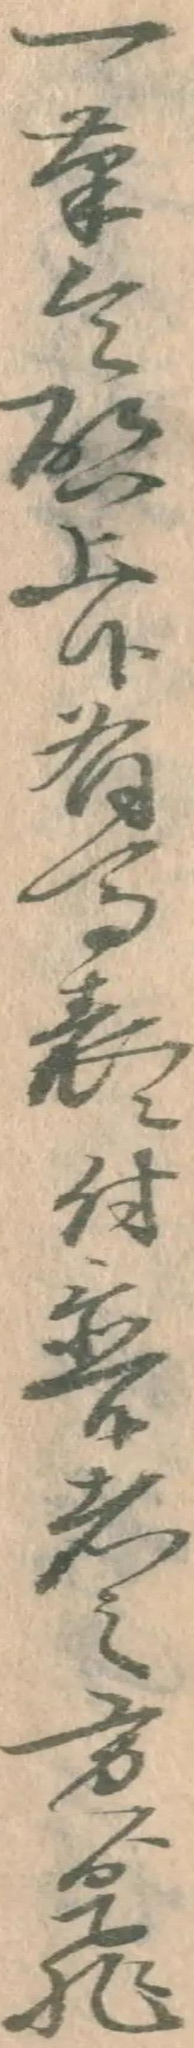一筆今啓上候有馬表に付置候者之方ゟ飛
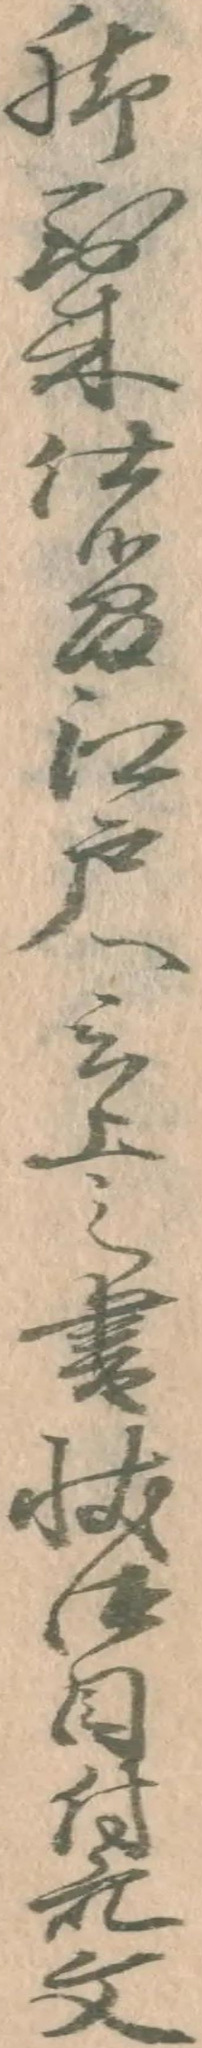脚到来仕候間江戸へ言上之書状御目付衆文
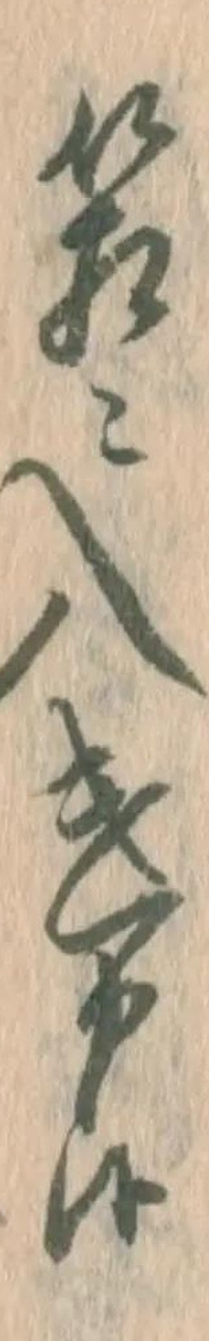箱に入遣申候
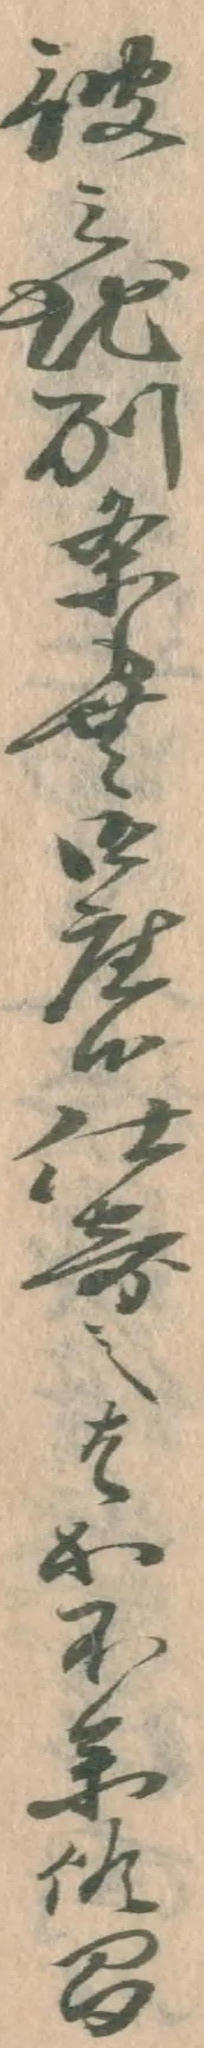一彼之地別条も無御座候仕寄之者等不参候間
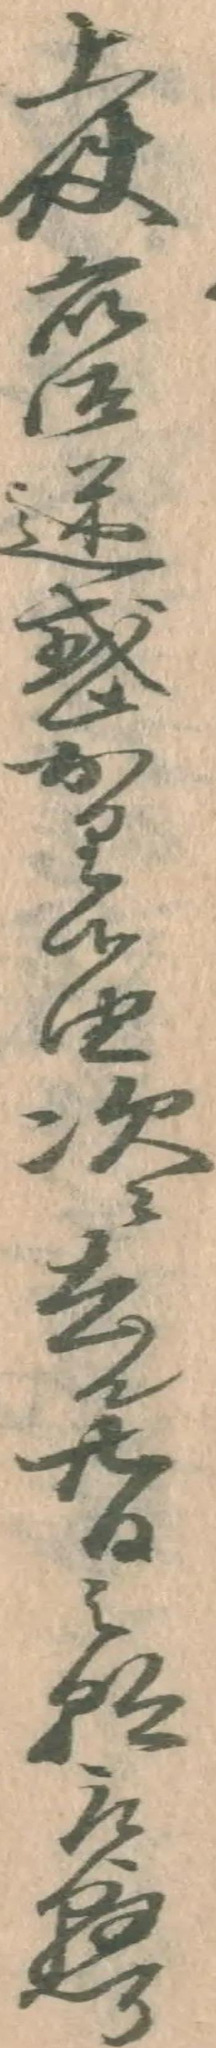上使衆御迷惑か里候由次に去る廿日之朝取懸り
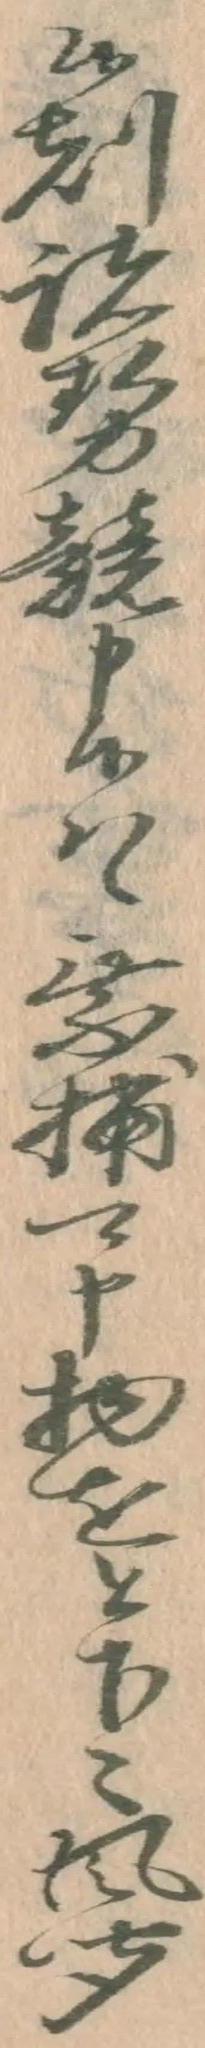候刻諸勢競申候はゝ乗捕可申物をと下々風聞
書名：切支丹御退治記 49巻. [5]
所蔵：国立国会図書館 National Diet Library, JAPAN
